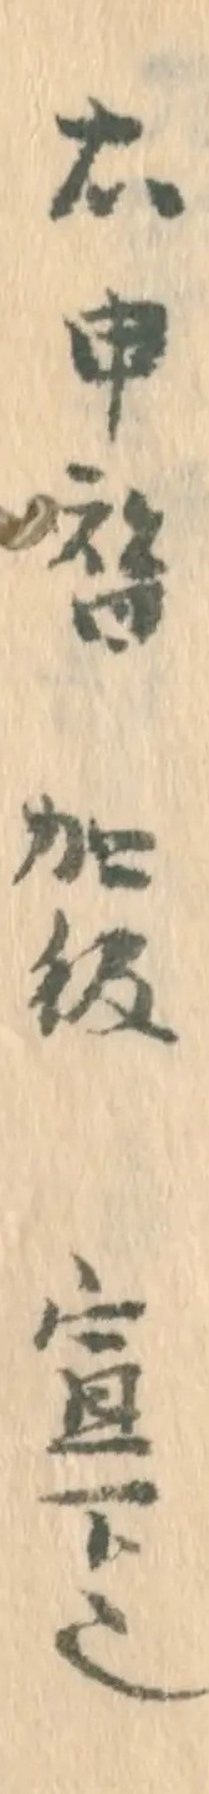右申替加級宣下也
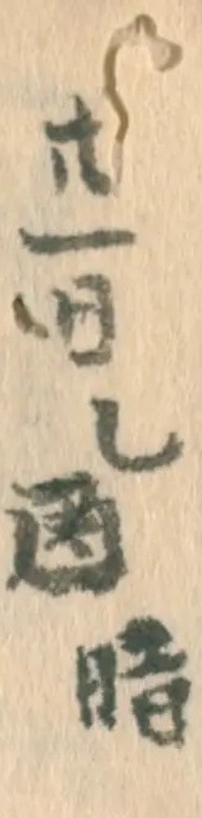廿一日乙巳晴
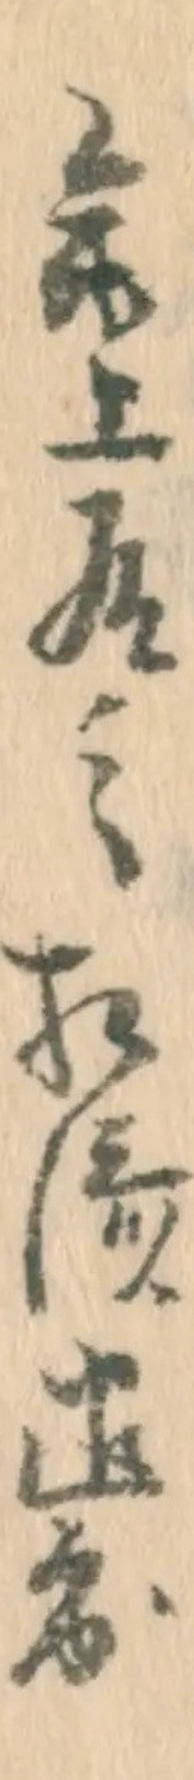参上有之相済退出
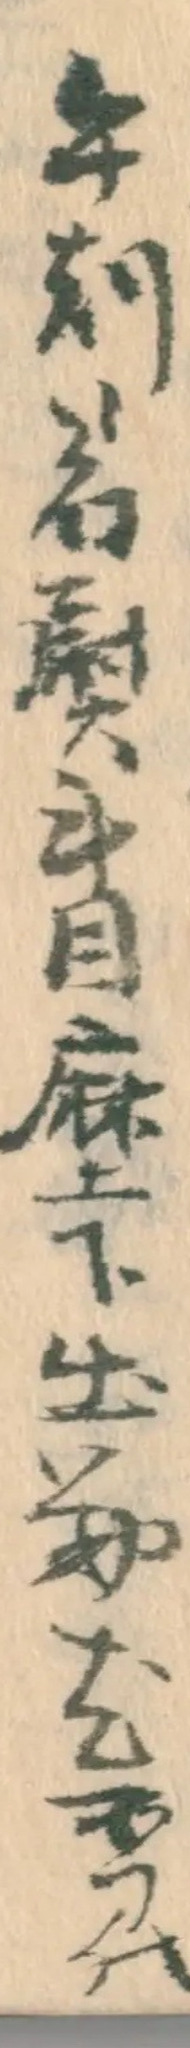午刻着熨斗目麻上下出勤尤所司代
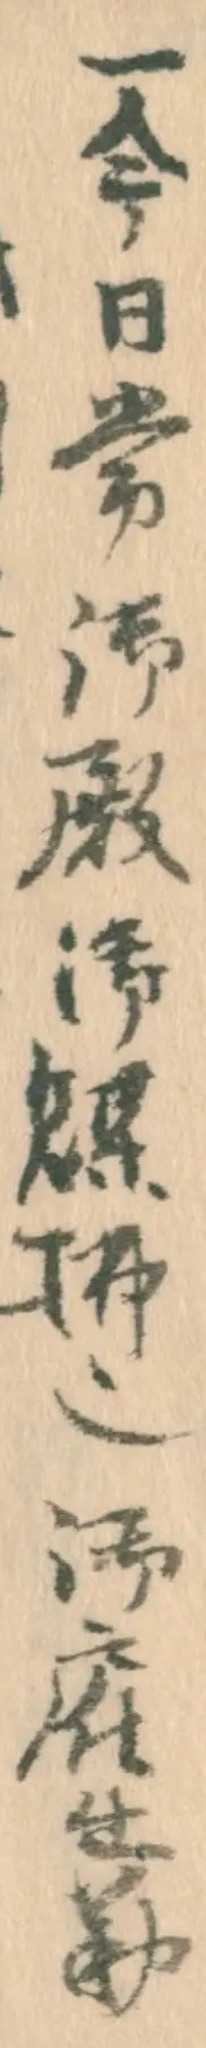一今日常御殿御煤払也御雇出勤
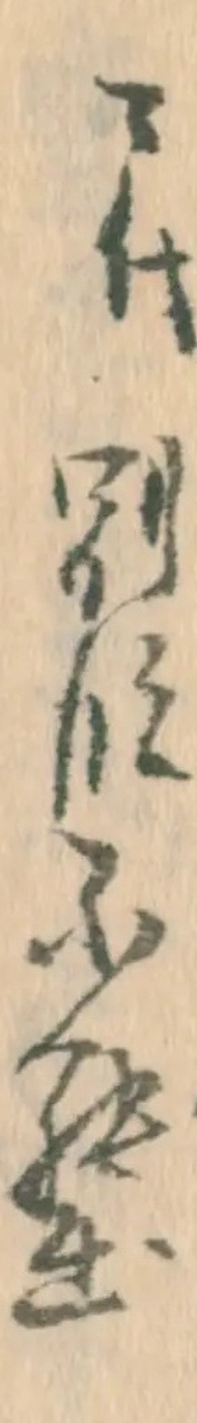ニ付別段不罷出
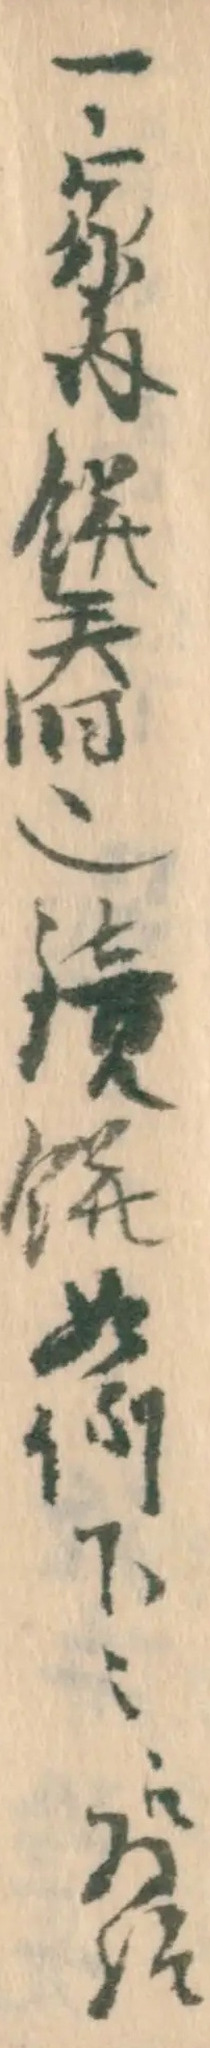一家内餅舂也鏡餅如例下々え為給
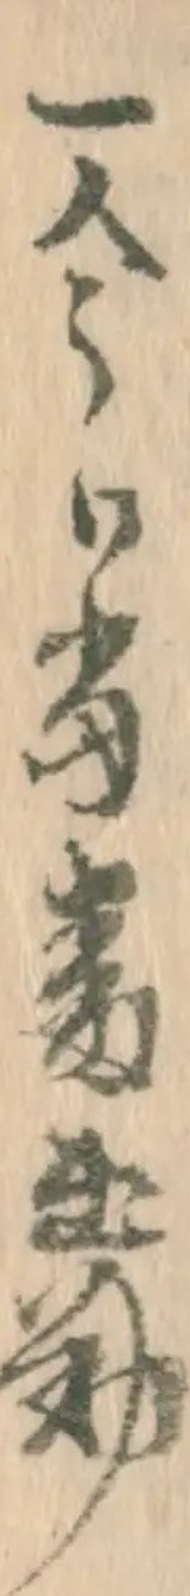一今日当番出勤
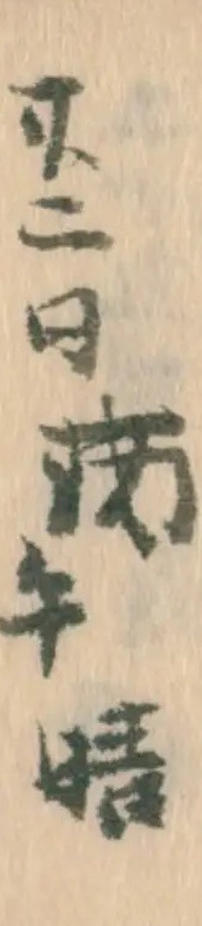廿二日丙午晴
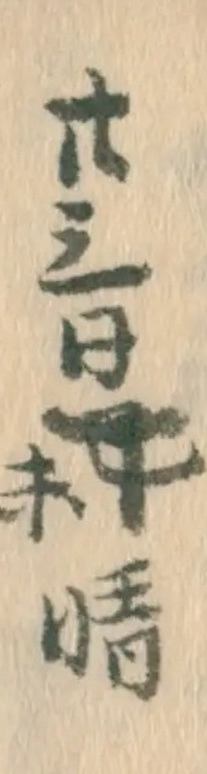廿三日丁未晴
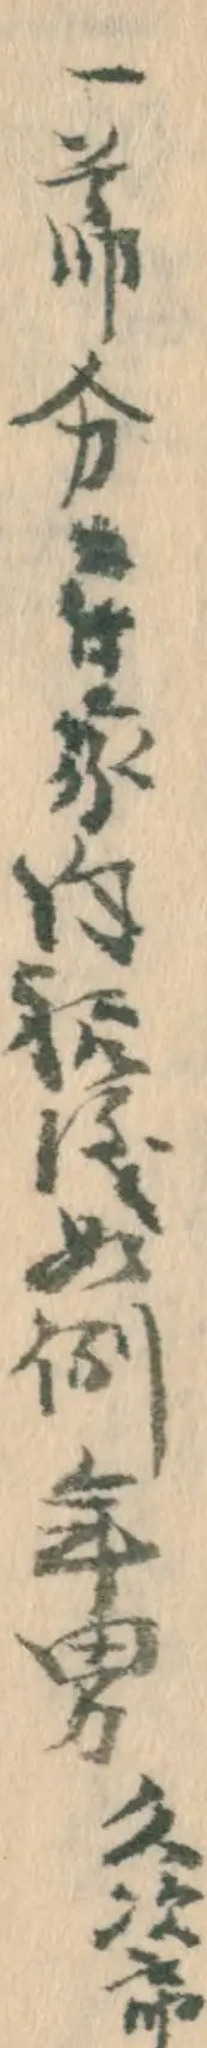一節分ニ付家内祝儀如例年男久次郎へ
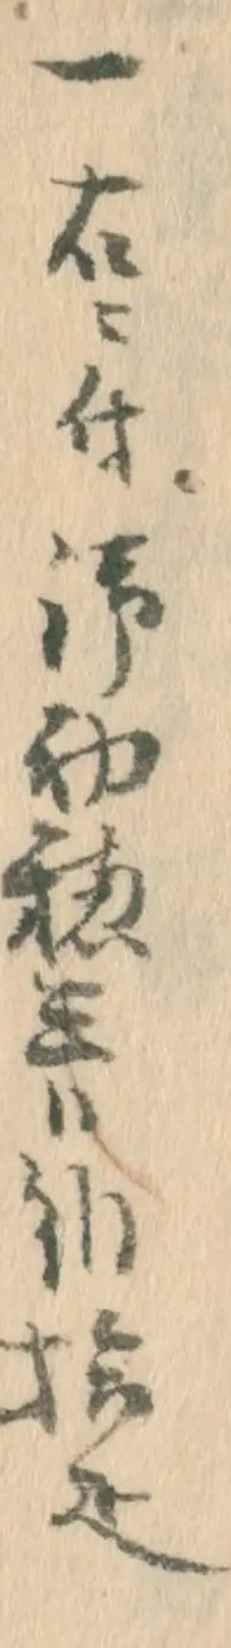一右ニ付御初穂青銅拾疋
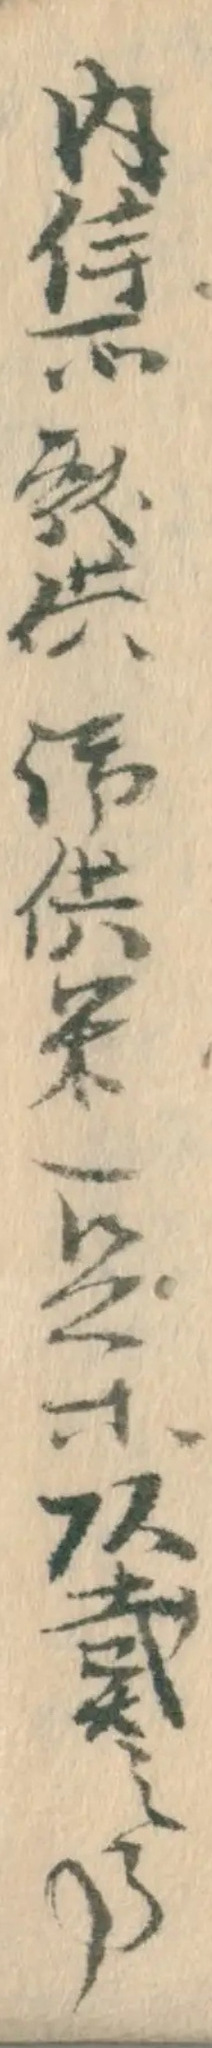内侍所献供御供米豆等頂戴之事

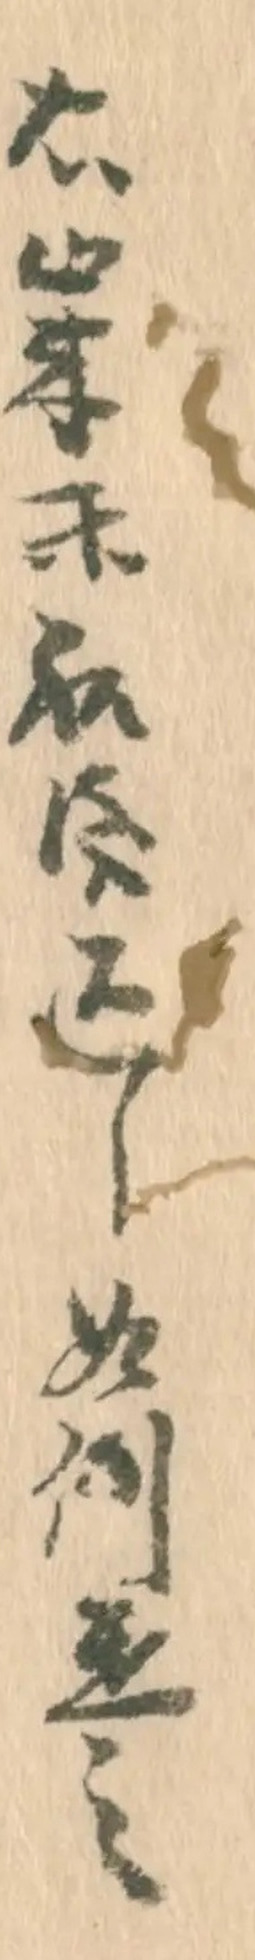右歳末祝儀返し如例遣之
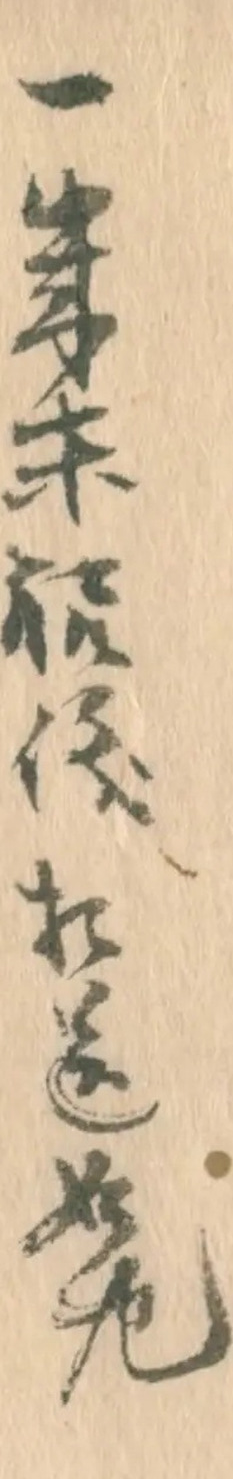一歳末祝儀相送如左
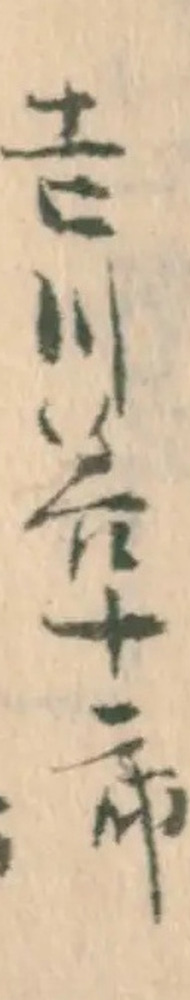吉川善十郎
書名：禁裏御所御用日記. [131]
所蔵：国立国会図書館 National Diet Library, JAPAN
